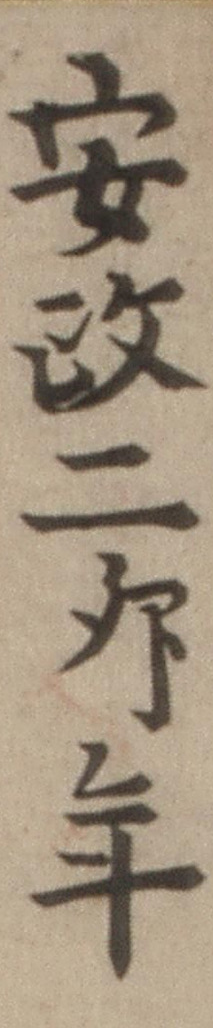安政二卯年
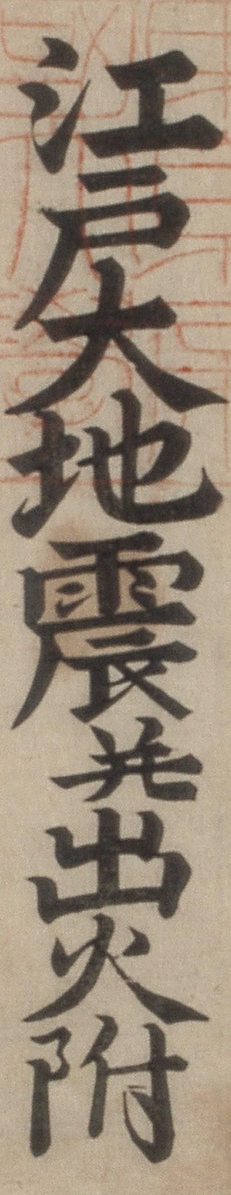江戸大地震並出火附
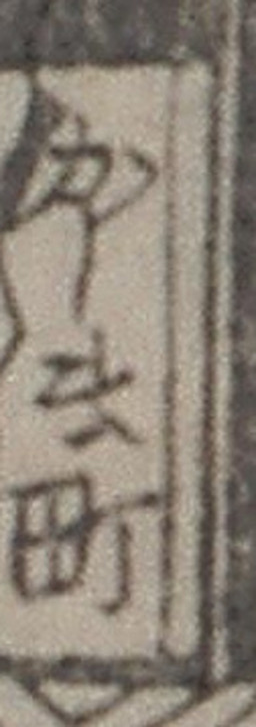かしま町
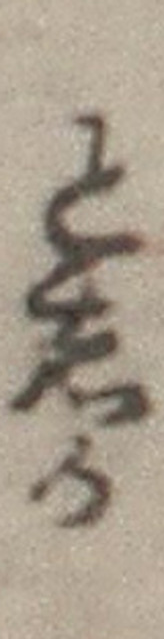としか
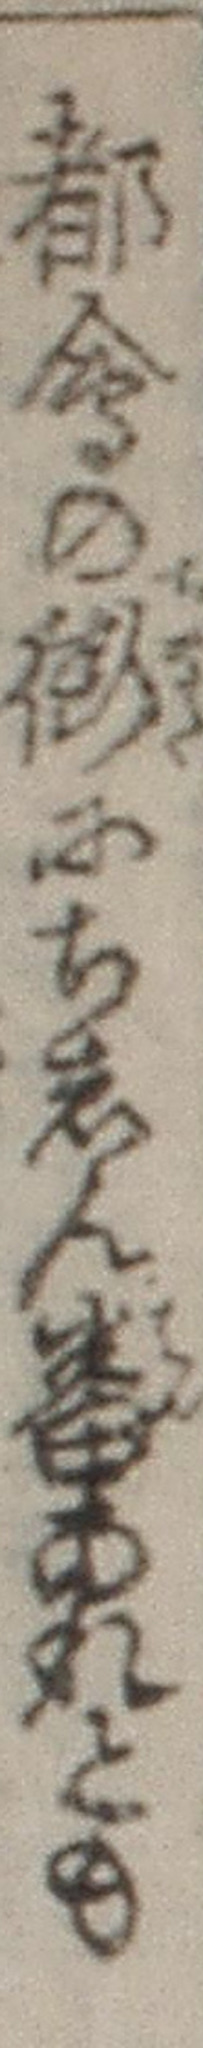都会の衝にちしん番あれとも
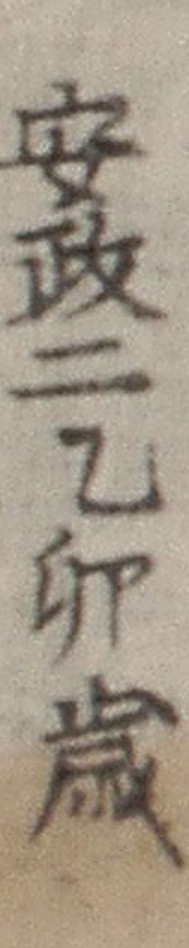安政二乙卯歳
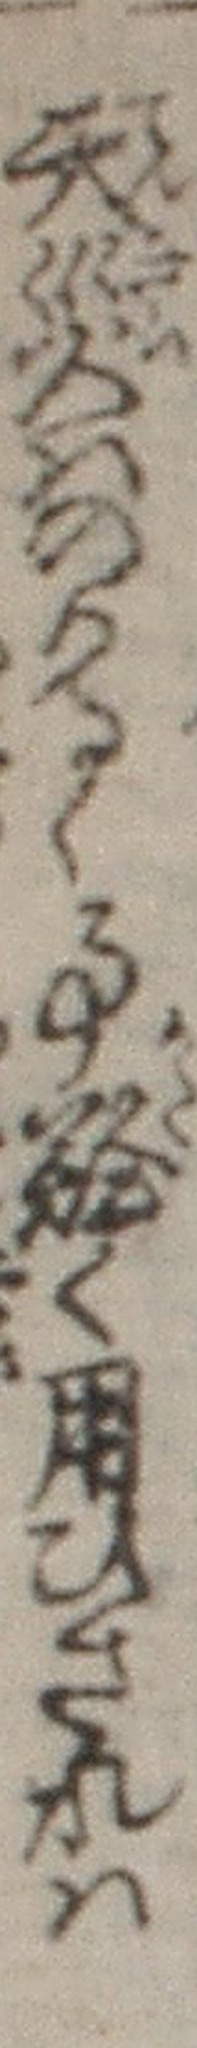天災はのかるゝ事難く用ひされは
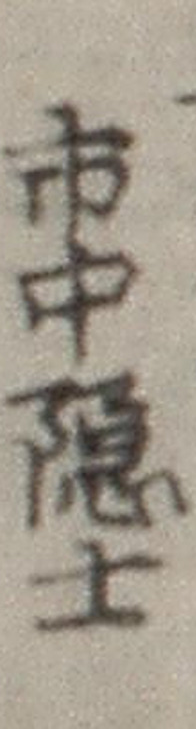市中隠士
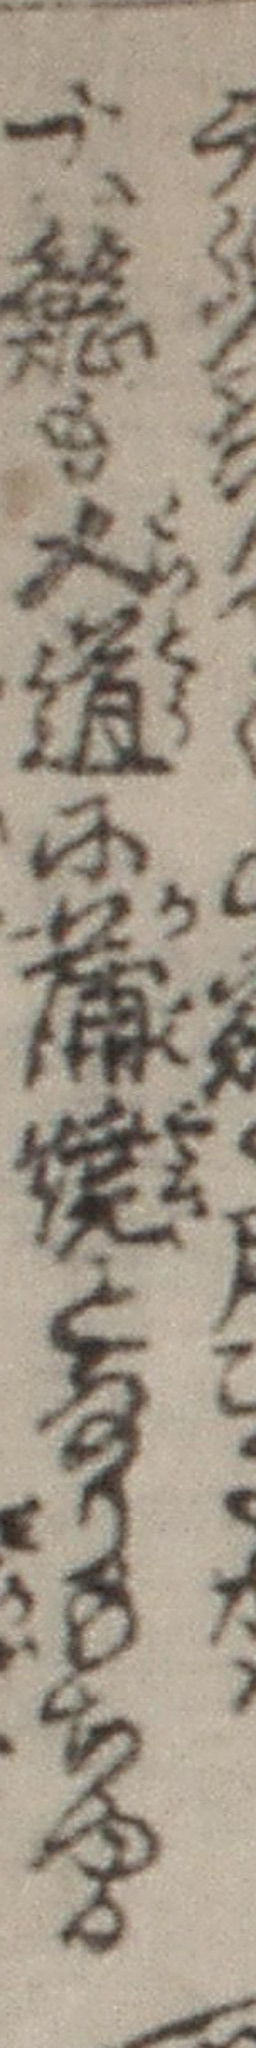大鯰も大道に蒲焼となりもちゆる
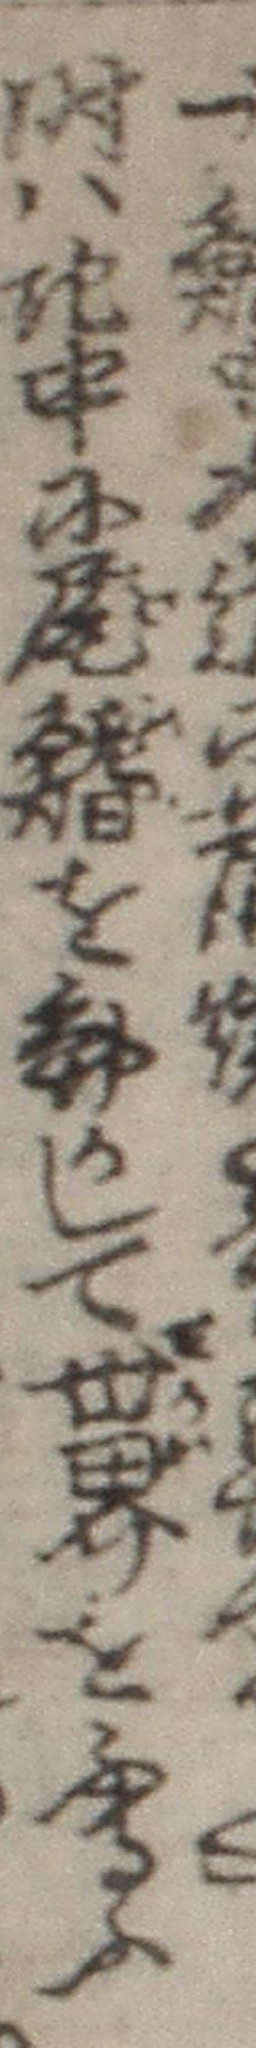時は地中に尾鰭を動かして世界をふるふ
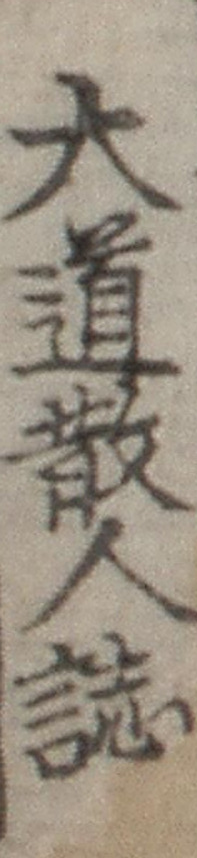大道散人誌
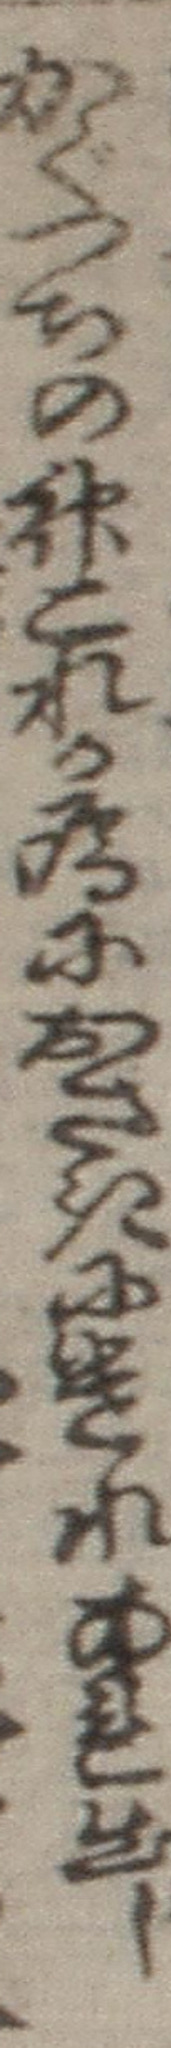かぐつちの神これが為におさきにけれあれ出し
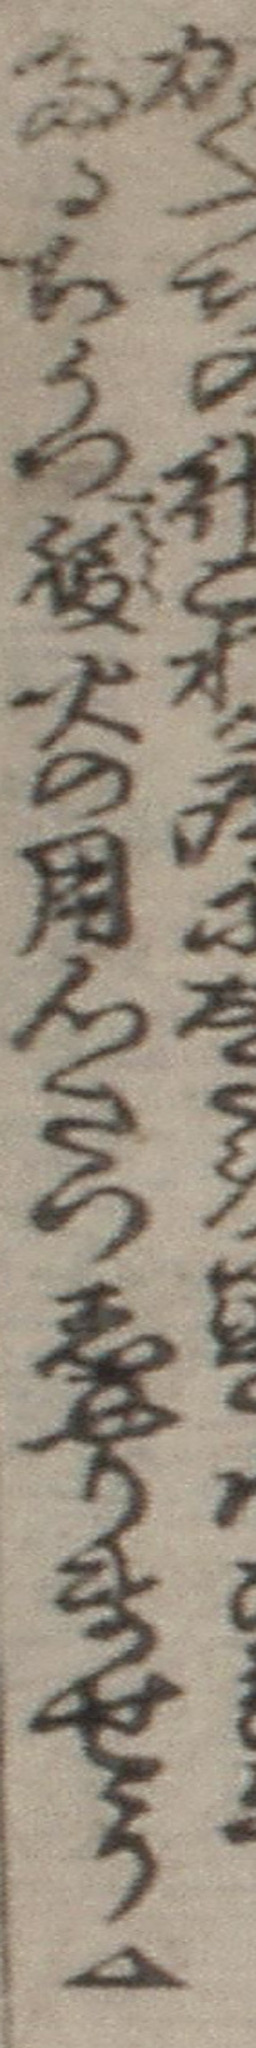たるちうつ腹火の用心さつしやりませう△

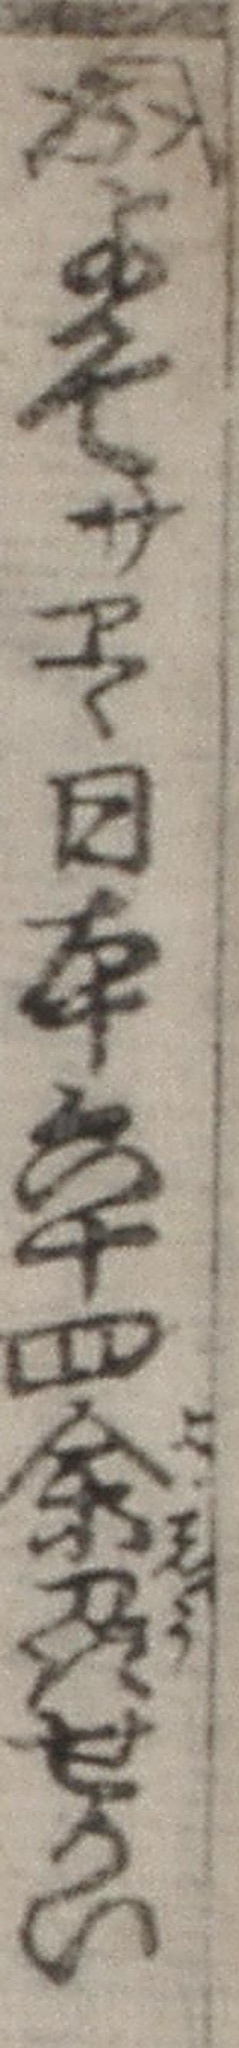およそサエゝ日本六十四余州せかい
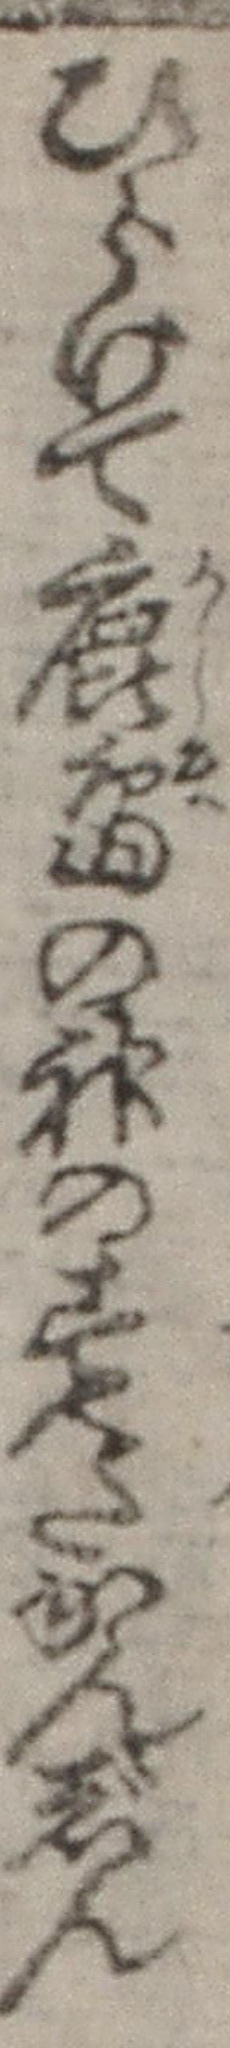ひらけて鹿島の神のすへたかんじん
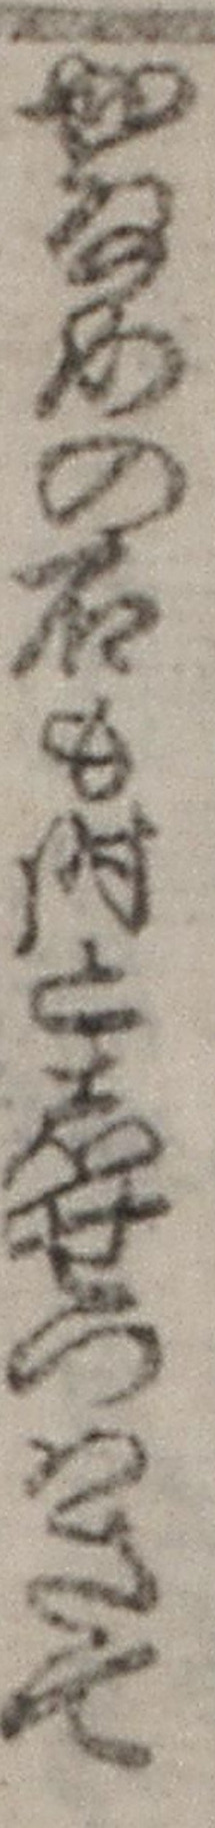かなめの石も時としせつはさて
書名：安政二卯年　江戸大地震并出火附
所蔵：東京大学地震研究所図書室 Earthquake Research Institute Library, The University of Tokyo, JAPAN
